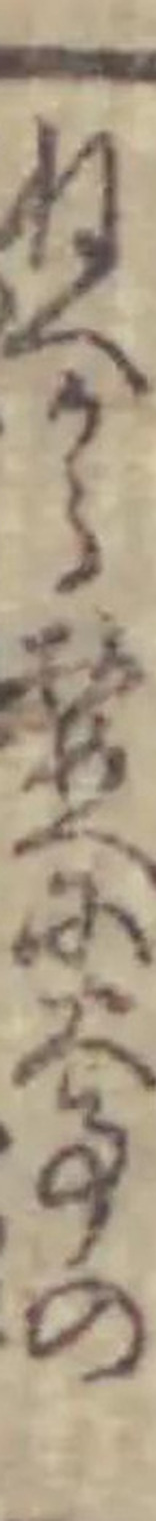ねへからおめへに大事の
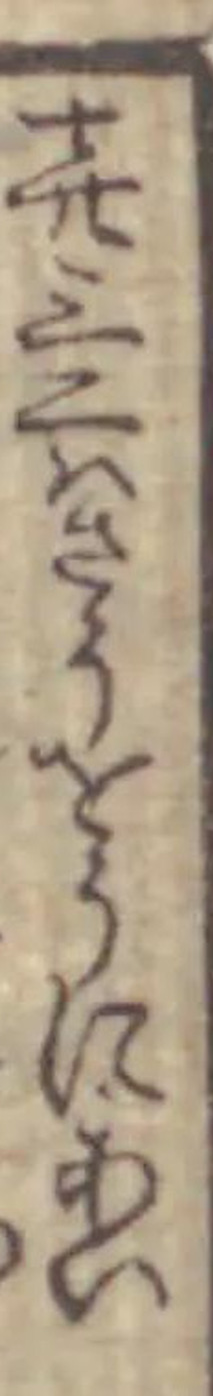喜三二はさうをうにあい
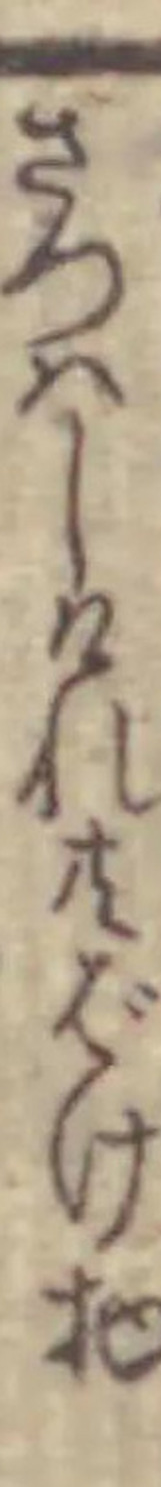さつはしけれ共ばけ物
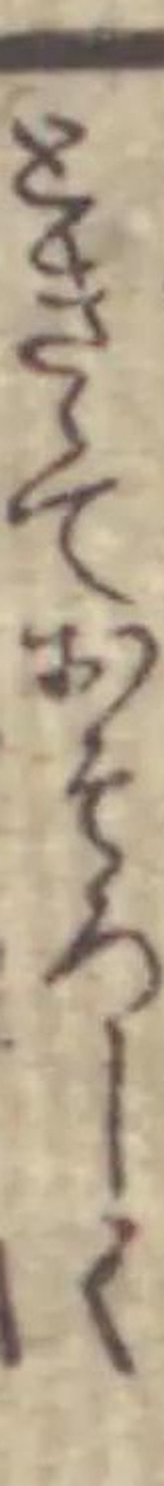ときゝておそろしく
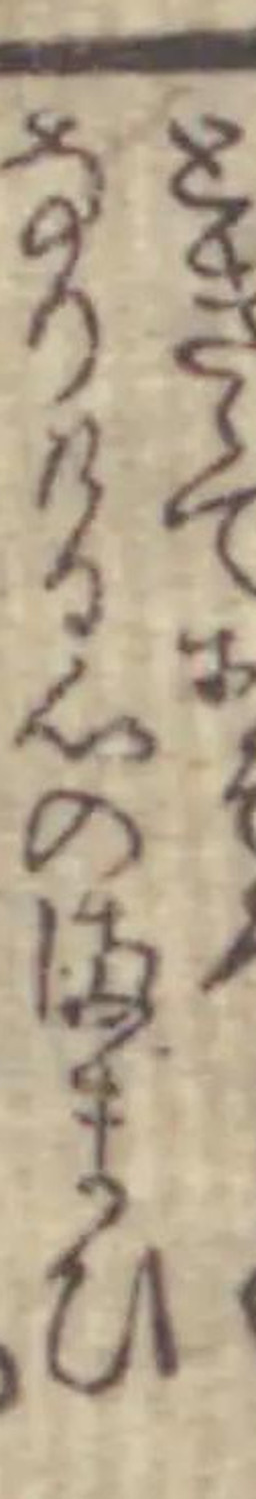なりける心のままひ
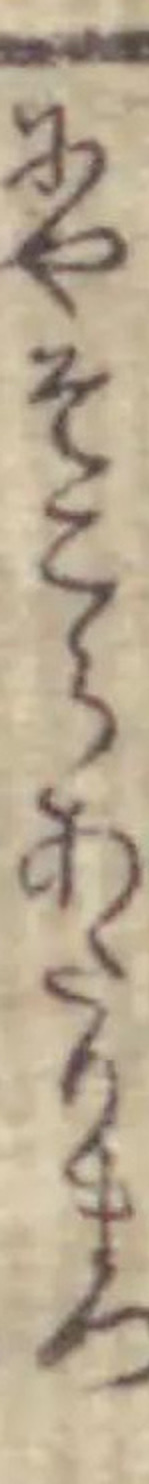にやそこらあたりまつ
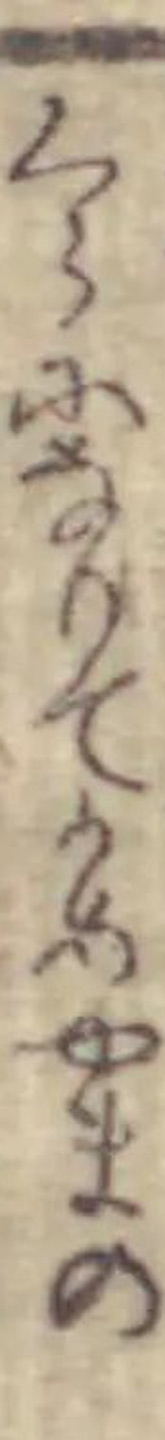くらになりてかめやまの
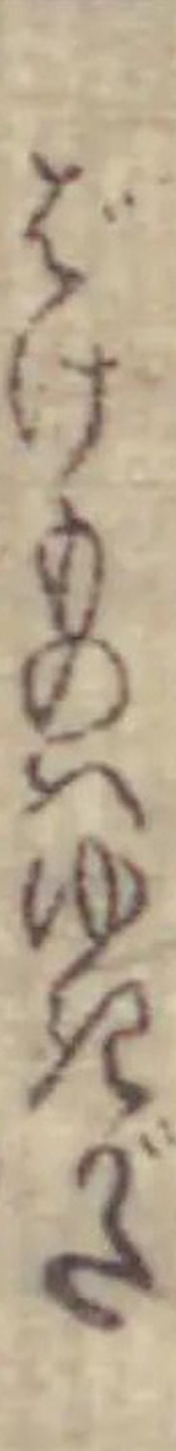ばけものはゆきがた
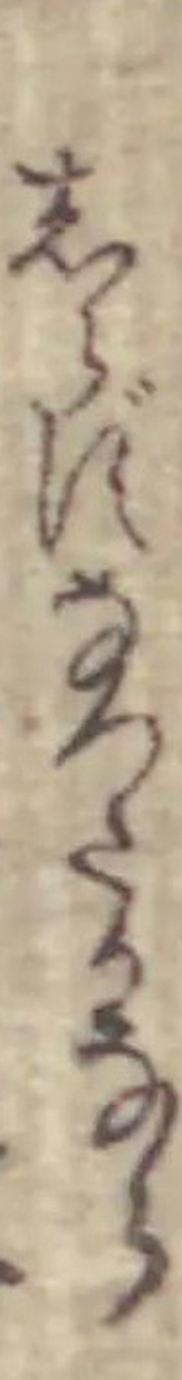しらずなつたかなら
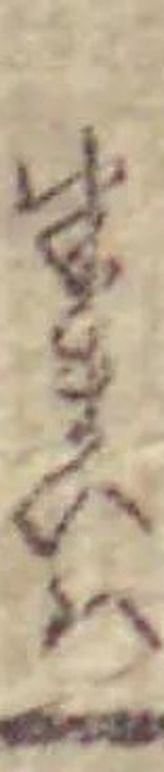半まいは
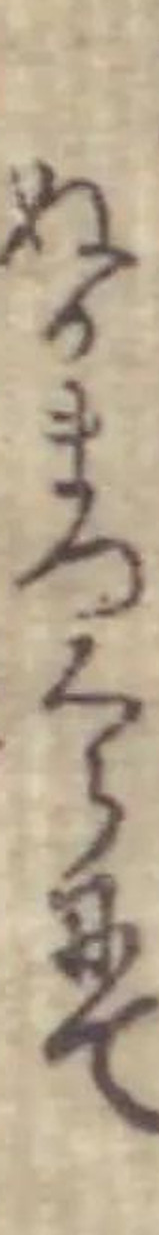ぬかまつくらにて
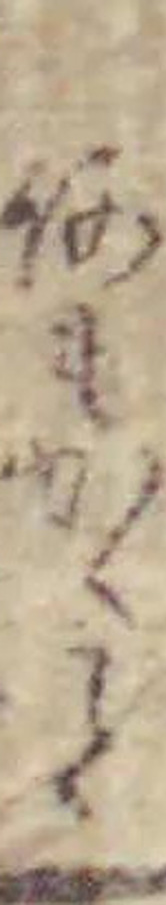何もかくこと
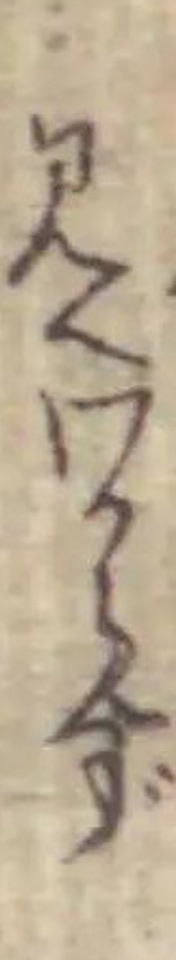みへわからず
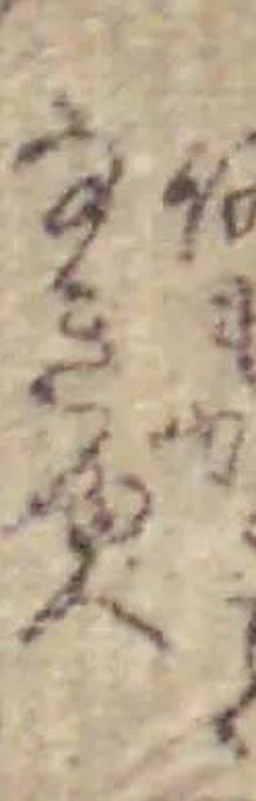なきゆへ
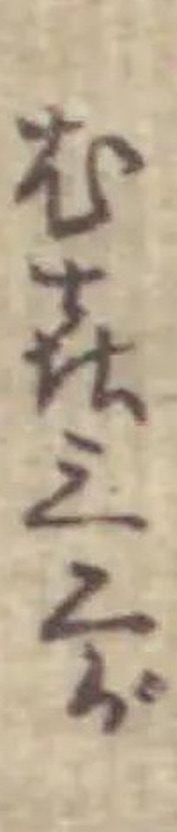尤喜三二が
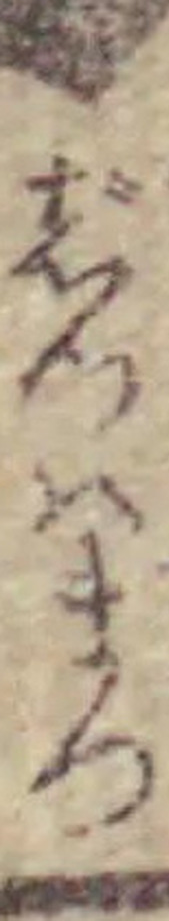じつはまつ
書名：亀山人家妖 3巻
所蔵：国立国会図書館 National Diet Library, JAPAN
